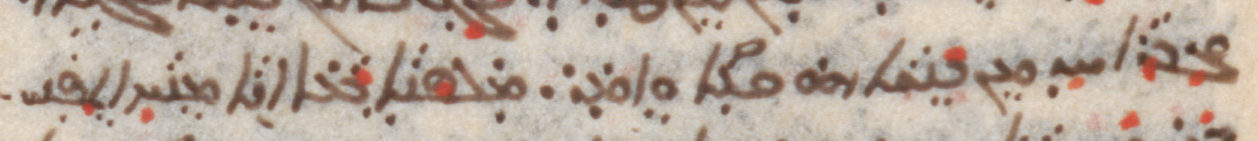ܘܓܒܪܐ ܚܕ ܡ̣ܢ ܟܢܫܐ ܗ̇ܘ ܩܥܐ ܘܐܡ̣ܪ. ܡܠܦܢܐ ܒܥ̇ܐ ܐܢܐ ܡܢܟ ܐܬܦܢܝ
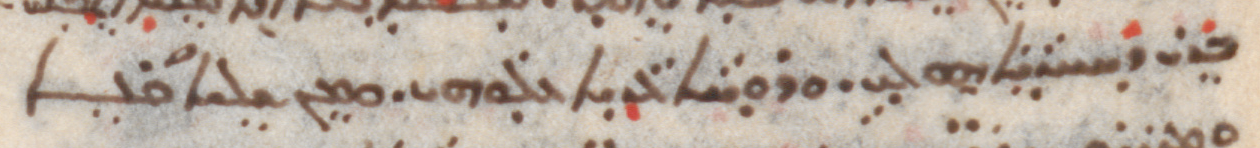ܒܪܝ ܕܝܚܝܚܕܝܐ ܗܘ ܠܝ. ܘܪܘܚܐ ܥܕܝܐ ܥܠܘܗܝ. ܘܡ̣ܢ ܫܠܝܐ ܩ̇ܢܐ
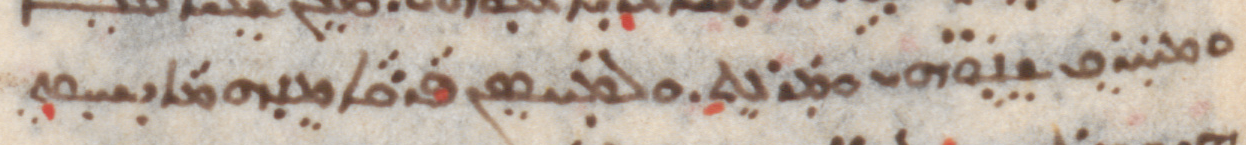ܘܡܚܪܩ ܫܢܘ̈ܗܝ ܘܡܪܥܬ. ܘܠܡܚܣܢ ܦܪܩܐ ܡܢܗ ܡܐ ܕܫܚܩܬ
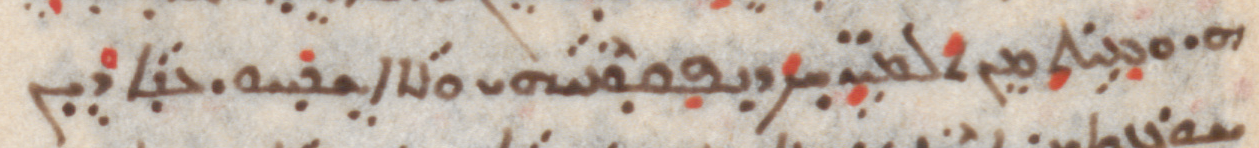ܗ. ܘܒܥܝܬ ܡ̣ܢ ܬܠܡܝ̈ܕܝܟ ܕܢܦܩܘܢܝܗܝ ܘܠܐ ܐܫܟ̣ܚܘ. ܥܢ̣ܐ ܕܝܢ
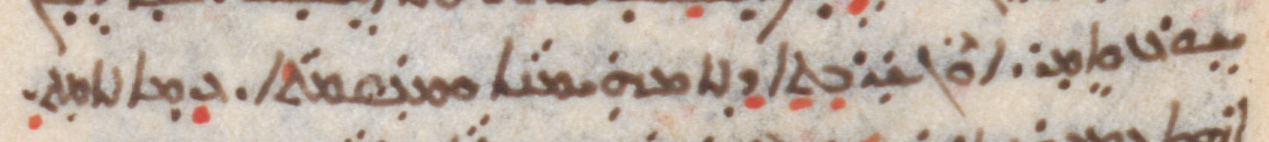ܝܫܘܥ ܘܐܡ̣ܪ. ܐܘܢ ܫܪܒܬܐ ܕܠܐ ܡܗܝܡܢܐ ܘܡܥܩܡܬܐ. ܟܕܡܐ ܠܐܡܬܝ
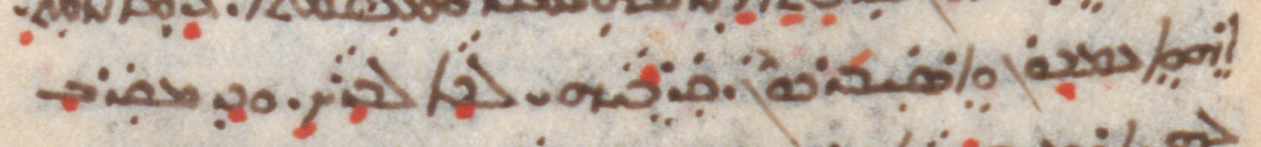ܐܗܘܐ ܥܡܟܘܢ ܘܐܣܝܒܪܟܘܢ. ܩܪܒܝܗܝ ܠܟܐ ܠܒܪܟ. ܘܟܕ ܡܩܪܒ
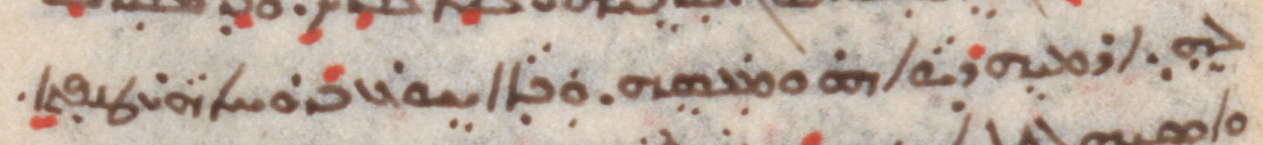ܠܗ܆ ܐܪܡܝܗ ܕܝܘܐ ܗܘ ܘܡܥܣܗ. ܘܟܐܐ ܝܫܘܥ ܒܪܘܚܐ ܗܝ ܛܢܦ̣ܬܐ.
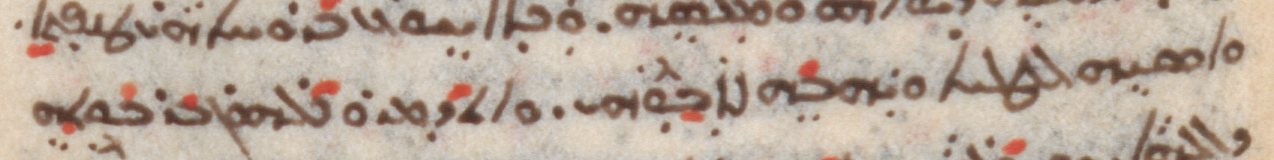ܘܐܣܝܗ ܠܛܠܝܐ ܘܝܗܒܗ ܠܐܒܘܗܝ. ܘܐܬܕܡܪܘ ܟܠܗܘܢ ܒܪܒܘܬܗ
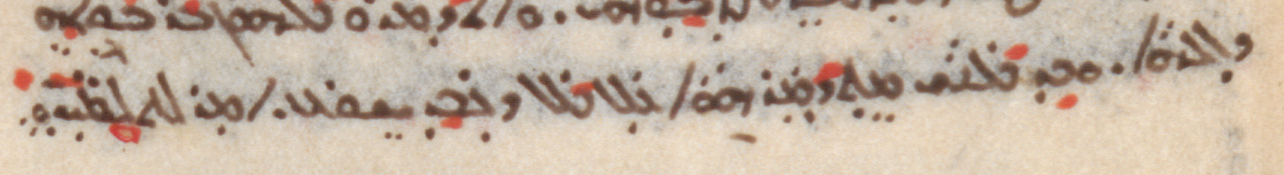ܕܐܠܗܐ. ܘܟܕ ܟܠܢܫ ܡܬܕܡܪ ܗܘܐ ܥܠ ܟܠ ܕܥ̇ܒܕ ܝܫܘܥ. ܐܡ̣ܪ ܠܬ܏ܠܡܝ̈ܕܘ
